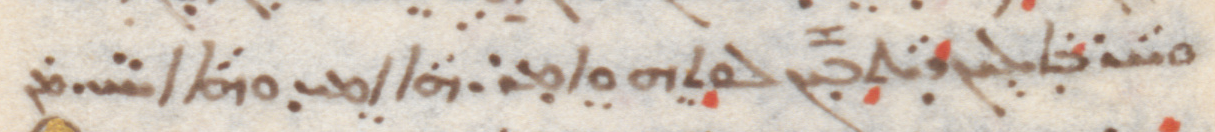ܘܚܪ ܒܐܝܠܝܢ ܕܝܬܒܝܢ ܠܘܬܗ ܘܐܡ̣ܪ. ܗܐ ܐܡܝ ܘܗܐ ܐܚ̈ܝ. ܡ̇ܢ
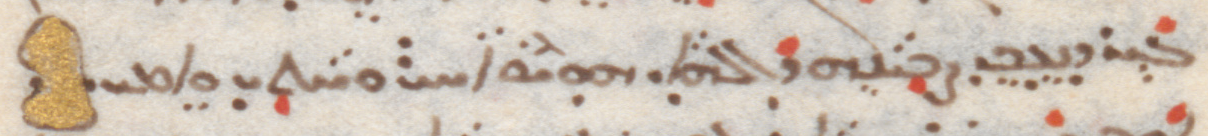ܓܝܪ ܕܢܥܒܕ ܨܒܝܢܗ ܕܐܠܗܐ܆ ܗܘܝܘ ܐܚ̈ܝ ܘܚܬܝ ܘܐܡܝ ܀
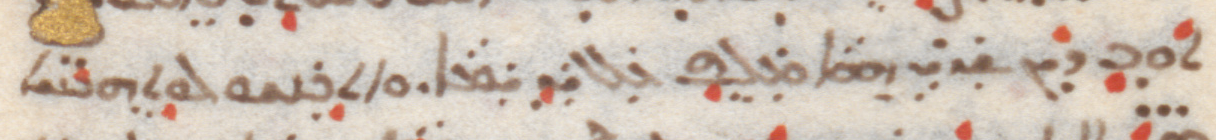ܬܘܒ ܕܝܢ ܫܪܝ ܗܘܐ ܡܠܦ ܥܠ ܝܕ ܝܡܐ. ܘܐܬܟܢܫܘ ܠܘܬܗ ܟܢ̈ܫܐ
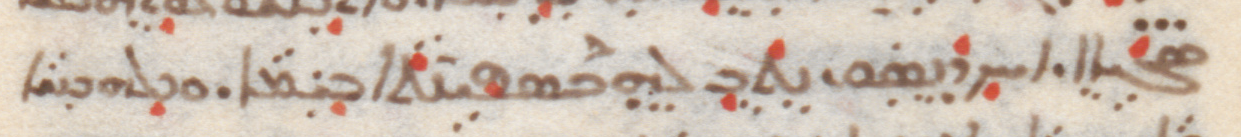ܣ̈ܓܝܐܐ. ܐܝܟ ܕܢܣ̣ܩ ܢܬܒ ܠܗ ܒܣܦܝܢܬܐ ܒܝܡܐ. ܘܟܠܗ ܟܢܫܐ
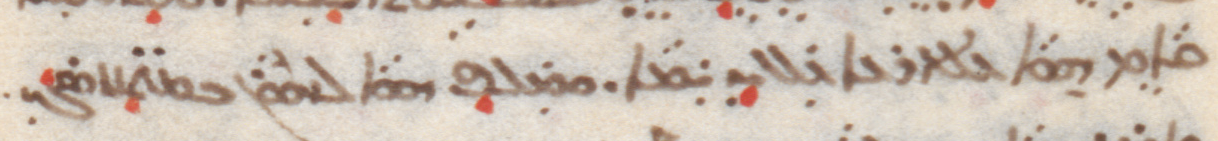ܩܐܡ ܗܘܐ ܥܠ ܐܪܥܐ ܥܠ ܝܕ ܝܡܐ. ܘܡܠܦ ܗܘܐ ܠܗܘܢ ܒܡܬ̈ܠܐ ܣܓܝ
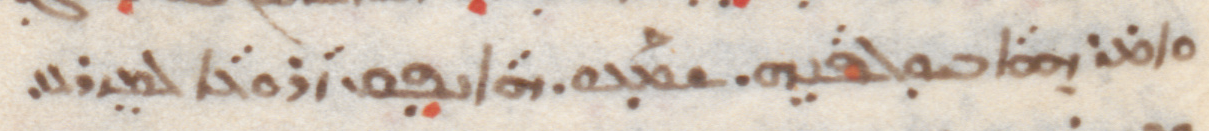ܘܐܡ̇ܪ ܗܘܐ ܒܝܘܠܦܢܗ. ܫܡ̣ܥܘ. ܗܐ ܢܦ̣ܩ ܙܪܘܥܐ ܠܡܙܪܥ
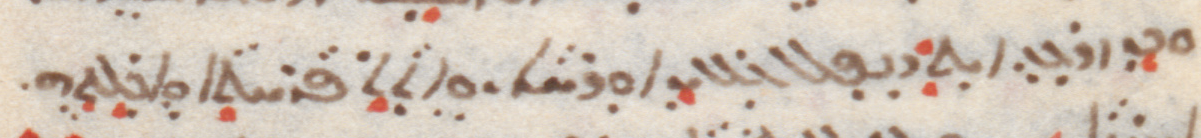ܘܟܕ ܙܪܥ܆ ܐܝܬ ܕܢܦ̣ܠ ܥܠܝ ܐܘܪܚܐ. ܘܐܬܬ݀ ܦܪܚܬܐ ܘܐܟܠܬܗ.
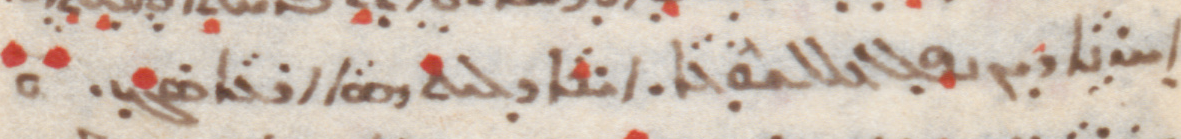ܐܚܪܢܐ ܕܝܢ ܢܦ̣ܠ ܥܠ ܫܘܥܐ. ܐܝܟܐ ܕܠܝܬ ܗܘܐ ܐܪܥܐ ܣ̇ܓܝ. ܏ܘ
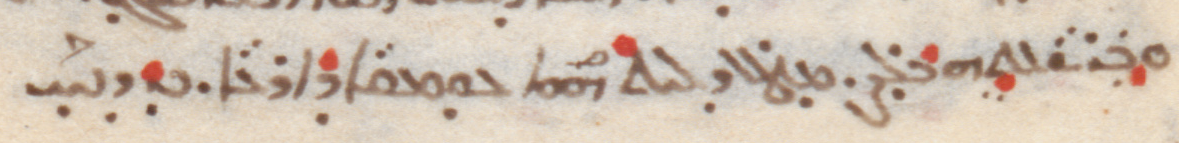ܘܒܪ ܫܠܬܗ ܒܠܨ. ܡܛܠ ܕܠܝܬ ܗܘܐ ܥܘܡܩܐ ܕܐܪܥܐ. ܟܕ ܕܢ̣ܚ
